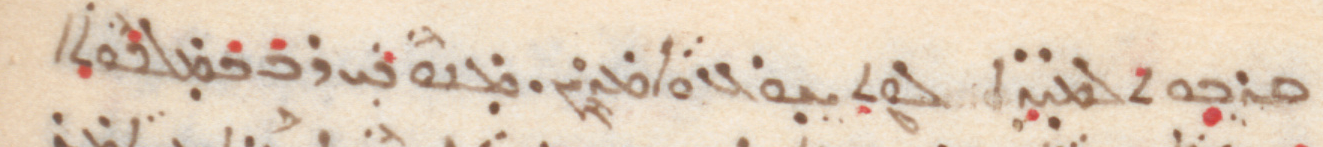ܩܪܒܘ ܬܠܡܝ̈ܕܐ ܠܘܬ ܝܥܫܘܥ ܘܐܡ̇ܪܝܢ. ܡܢܘ ܟܝ ܪܒ ܒܡܠܟܘܬܐ
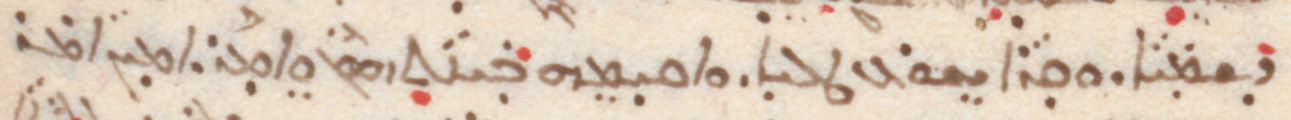ܕܫܡܝܐ. ܘܩ̣ܪܐ ܝܫܘܥ ܛܠܝܐ܆ ܘܐܩܝܡܗ ܒܝܢܬܗܘܢ ܘܐܡ̣ܪ. ܐܡܝܢ ܐܡ̇ܪ
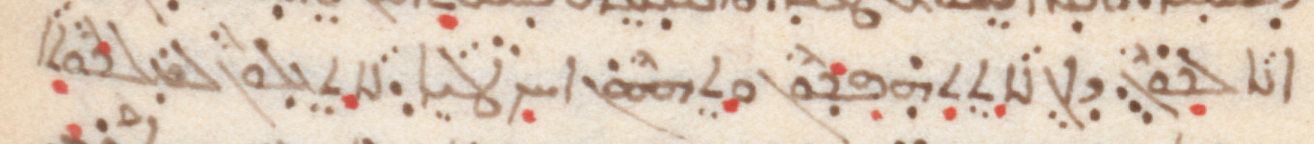ܐܢܐ ܠܟܘܢ܆ ܕܐܢ ܠܐ ܬܬܗܦܟܘܢ ܘܬܗܗܘܢ ܐܝܟ ܛܠܝܐ܆ ܠܐ ܬܥܠܘܢ ܠܡܠܟܘܬܐ
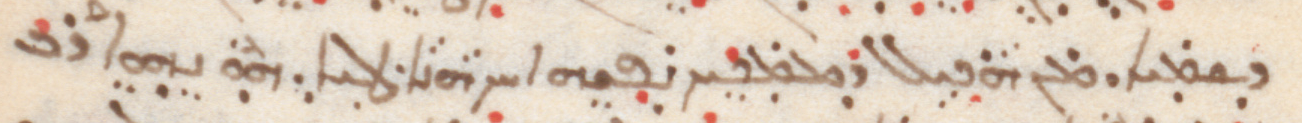ܕܫܡܝܐ. ܡ̇ܢ ܗܟܝܠ ܕܡܡܟܟ ܢܦܫܗ ܐܝܟ ܗܢܐ ܛܠܝܐ܆ ܗ̣ܘ ܢܗܘܐ ܪܒ
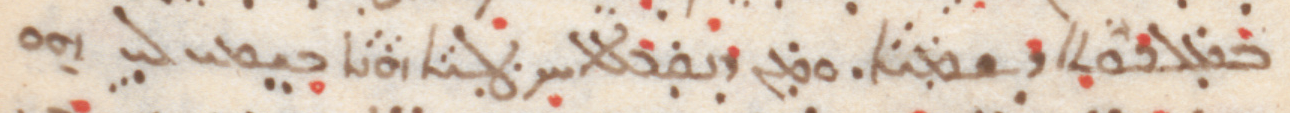ܒܡܠܟܘܬܐ ܕܫܡܝܐ. ܘܡܢ ܕܢܩܒܠ ܐܝܟ ܛܠܝܐ ܗܢܐ ܒܫܡܝ ܠܝ ܗܘ
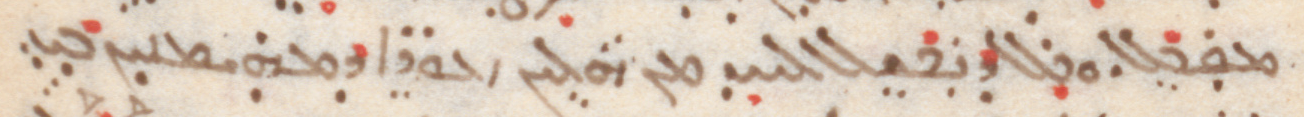ܡܩܒܠ. ܘܟܠ ܕܢܟܫܠ ܠܚܕ ܡܢ ܗܠܝܢ ܙܥܘܪ̈ܐ ܕܡܗܝܡܢܝܢ ܒܝ܆
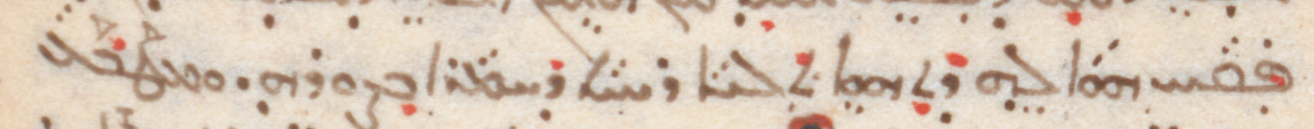ܦܩܚ ܗܘܐ ܠܗ ܕܬܗܘܐ ܬܠܝܐ ܪܝܚܐ ܕܚܡܪܐ ܒܨܘܪܗ܆ ܘܡܛܒܥ
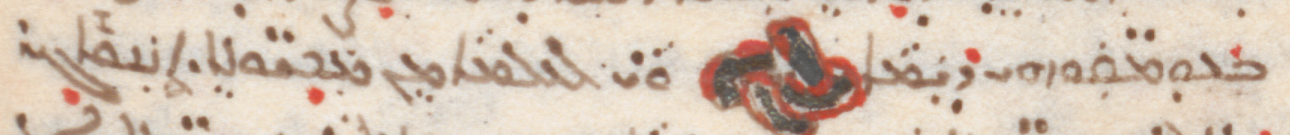ܒܥܘܡ̈ܩܘܗܝ ܕܝܡܐ ܀ ܘ̇ܝ ܠܥܠܡܐ ܡܢ ܡܟܫ̈ܘܠܐ. ܐܢܢܩܐ ܓܝܪ
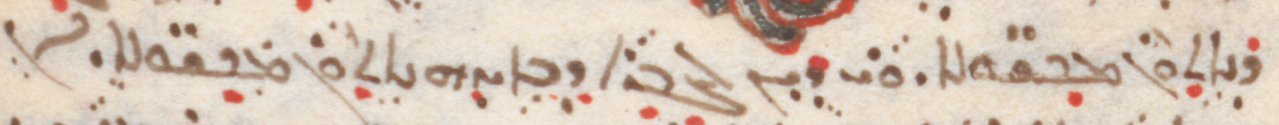ܕܢܐܬܘܢ ܡܟܫ̈ܘܠܐ. ܘ̇ܝ ܕܝܢ ܠܓܒܪܐ ܕܒܐܝܕ ܗܢܐܬܘܢ ܡܟܫ̈ܘܠܐ. ܐܢ
